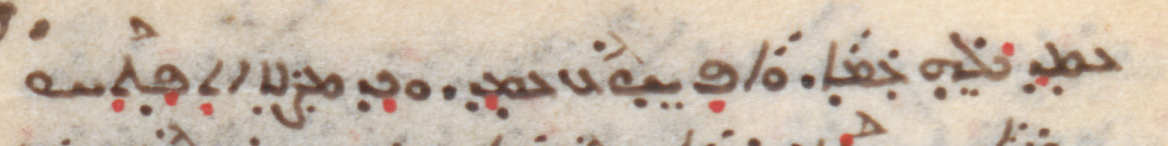ܥܡ̣ܕ ܟܠܗ ܥܡܐ܆ ܘܐܦ ܝܫܘܥ ܥܡ̣ܕ. ܘܟܕ ܡܨܠܐ ܐܬܦܬܚܘ
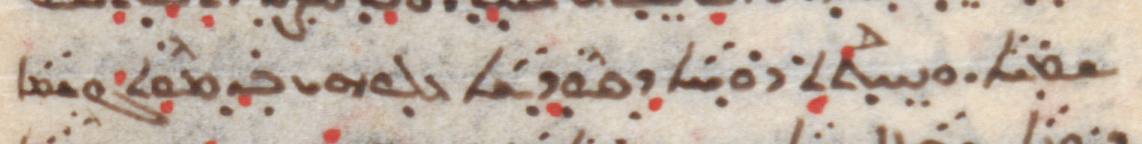ܫܡ̈ܝܐ. ܘܢܚܬܬ݀ ܪܘܚܐ ܕܩܘܕܫܐ ܥܠܘܗܝ ܒܕܡܘܬ ܓܘܫܡܐ
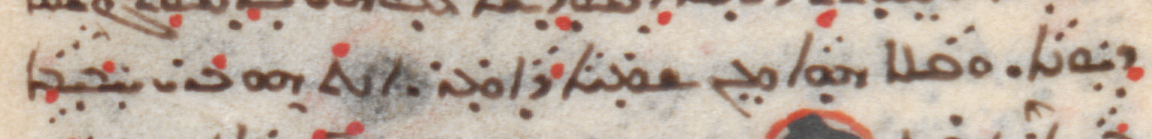ܕܝܘܢܐ. ܘܩܠܐ ܗܘ̣ܐ ܡ̣ܢ ܫܡܝܐ ܕܐܡ̇ܪ. ܐܢܬ ܗܘ ܒܪܝ ܚܒܝܒܐ
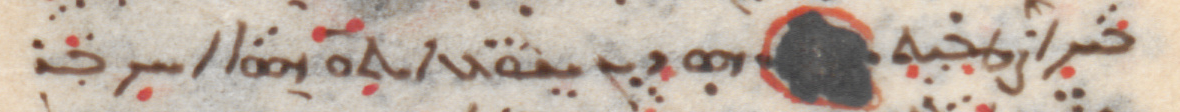ܒܟ ܐܨܛܒܝܬ .܀. ܗ̣ܘ ܕܝܢ ܝܫܘܥ ܐܝܬ܏ܘ ܗܘܐ ܐܝܟ ܒܪ
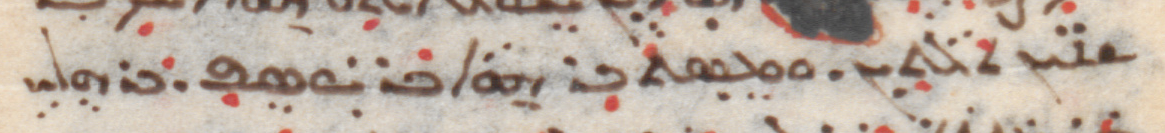ܫܢ̈ܝܢ ܬܠܬܝܢ. ܘܡܣܬܒܪ ܗܘܐ ܒܪ ܝܘܣܦ. ܒܪ ܗܠܝ
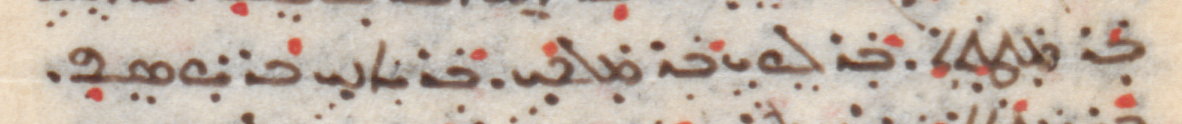ܒܪ ܡܛܬܬ. ܒܪ ܠܘܝ ܒܪ ܡܠܟܝ. ܒܪ ܝܐܢܝ ܒܪ ܝܘܣܦ.
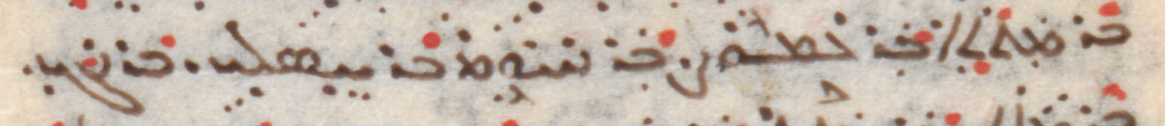ܒܪ ܡܬܬܐ ܒܪ ܥܡܘܨ. ܒܪ ܢܚܘܡ ܒܪ ܚܣܠܝ. ܒܪ ܢܓܝ܆
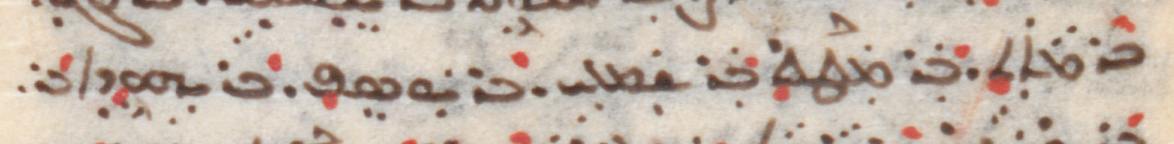ܒܪ ܡܐܬ. ܒܪ ܡܛܬ ܒܪ ܫܡܥܝ. ܒܪ ܝܘܣܦ. ܒܪ ܝܗܘܕܐ ܒܪ.
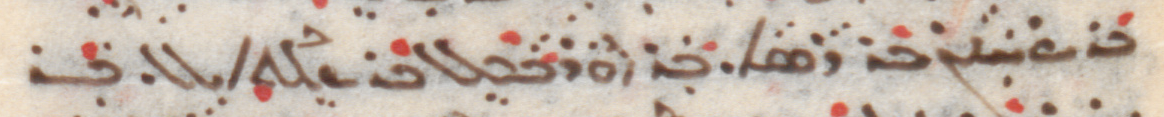ܒܪ ܝܘܚܢܢ ܒܪ ܪܣܐ. ܒܪ ܙܘܪܒܒܠ ܒܪ ܫܠܬܐܝܠ. ܒܪ
